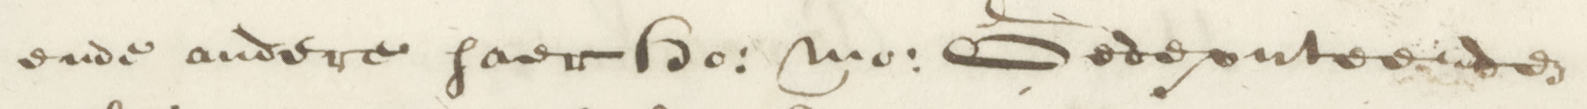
ende andere haer Ho:Mo: Gedeputeerden
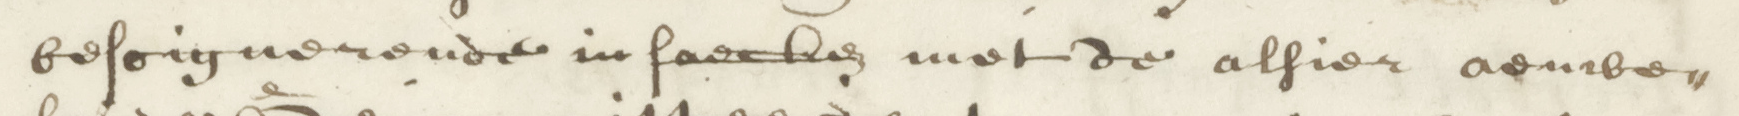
besoignerende in saecken met de alhier aenwe„
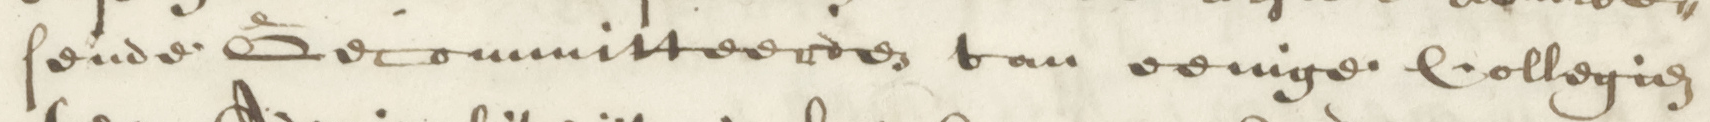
sende Gecommitteerden van eenige Collegien
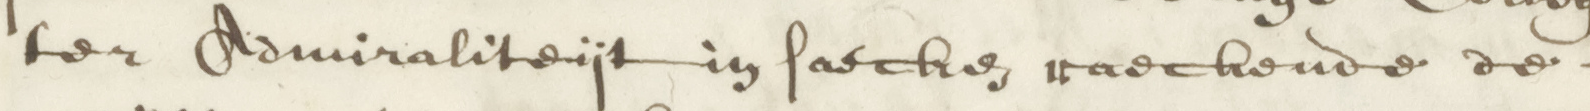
ter Admiraliteijt in saecken raeckende de
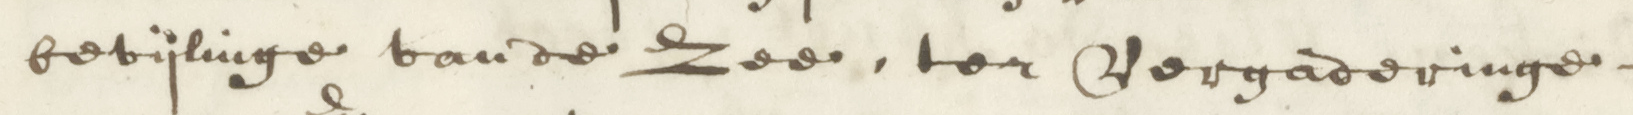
bevijlinge van de Zee, ter Vergaderinge
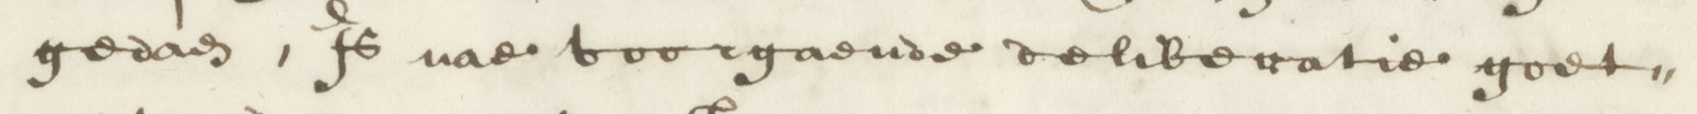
gedaen, Is nae voorgaende deliberatie goet„
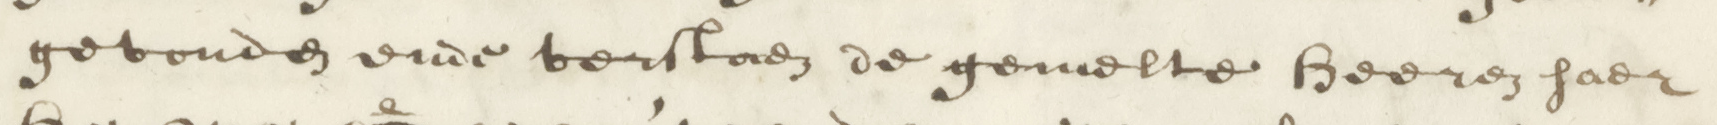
gevonden ende verstaen de gemelte Heeren haer
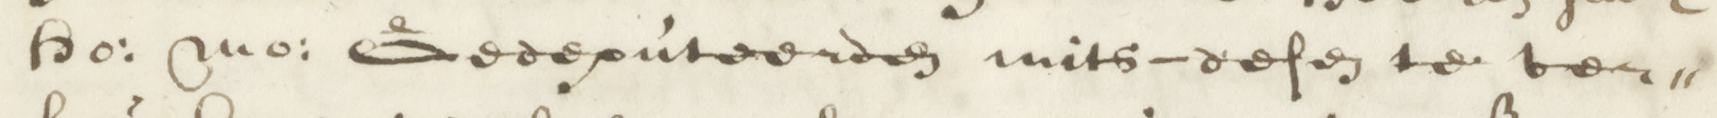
Ho:Mo: Gedeputeerden mits-desen te ver„
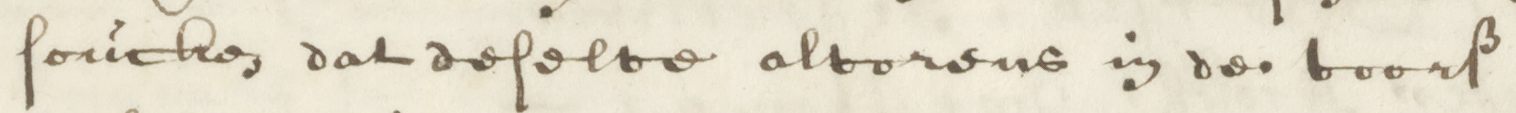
soucken dat deselve alvorens in de voors
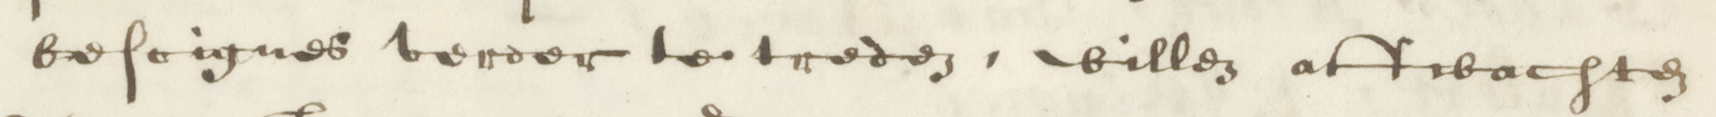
besoignes verder te treden, willen affwachten
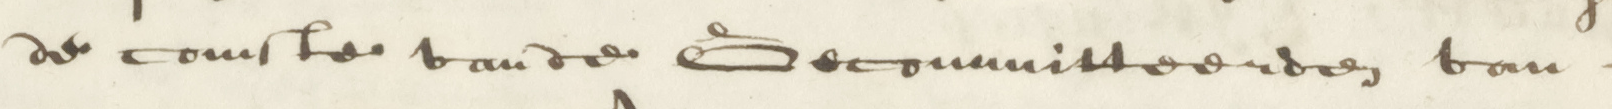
de comste van de Gecommitteerden van
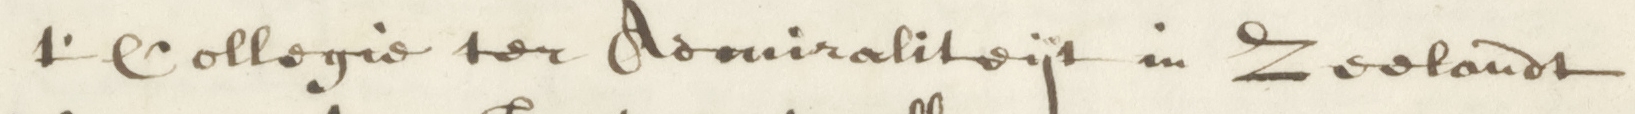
t' Collegie ter Admiraliteijt in Zeelandt,
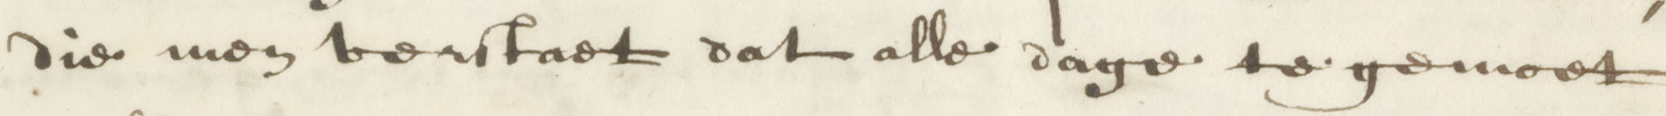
die men verstaet dat alle dage te gemoet
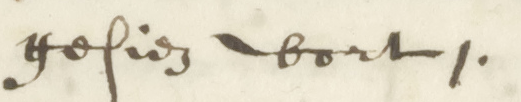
gesien wort.
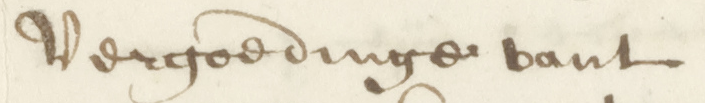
Vergoedinge vant
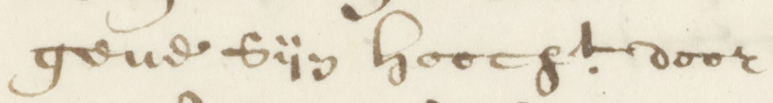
gene sijn hoocht door
